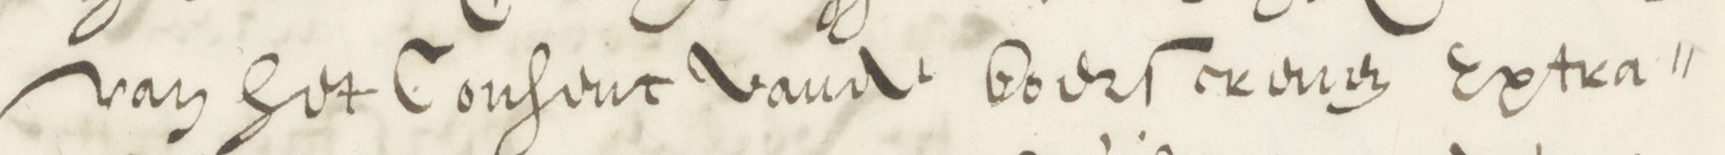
van het consent vande voerscreuen extra„
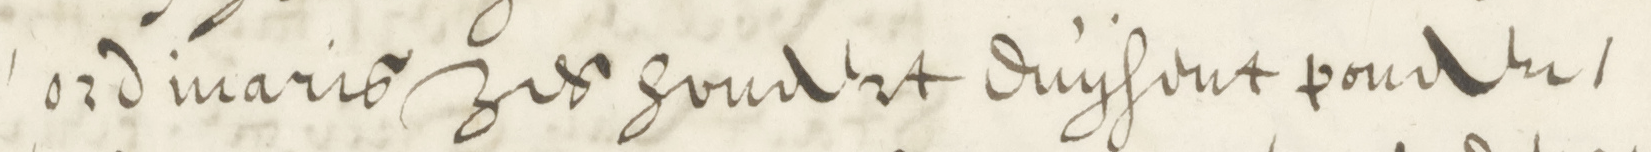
ordinaris zes hondert duijsent ponden.
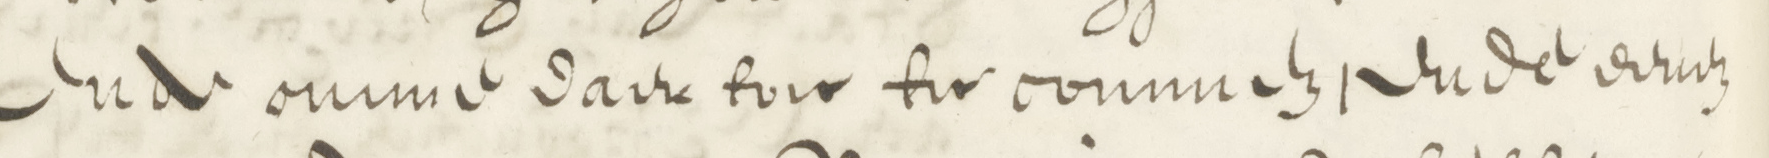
Ende omme daer toe te commen, ende eenen
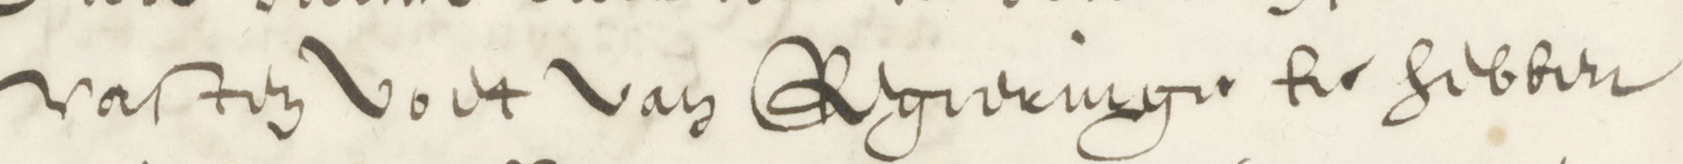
vasten voet van Regieringe te hebben
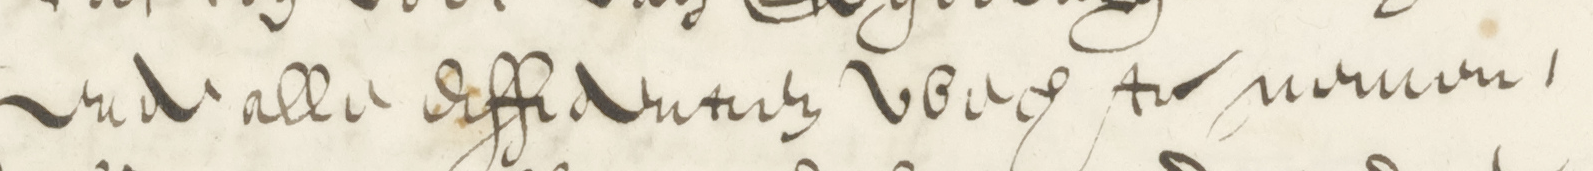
ende alle diffidenten wech te nemen,
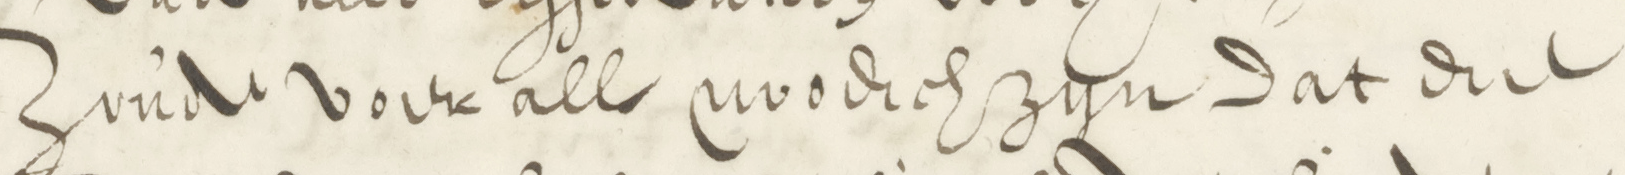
zoude voer all noodich zijn dat die
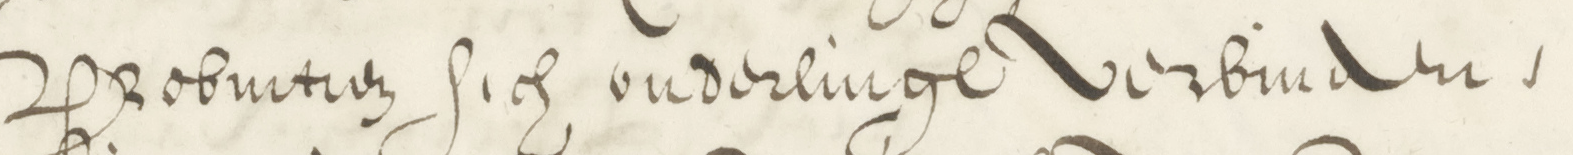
Provintien sich onderlingh verbinden,
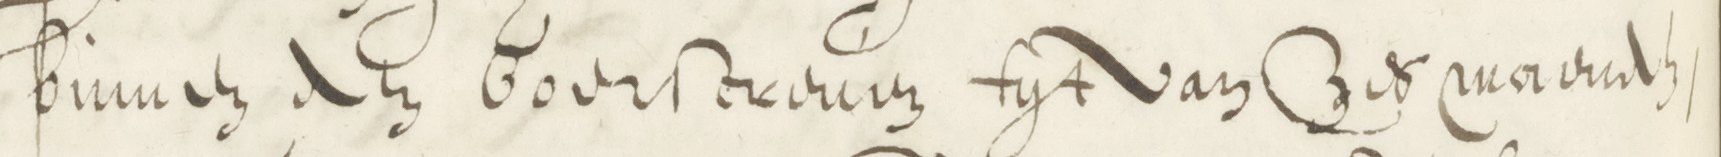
binnen den voerscreuen tyt van zes maenden
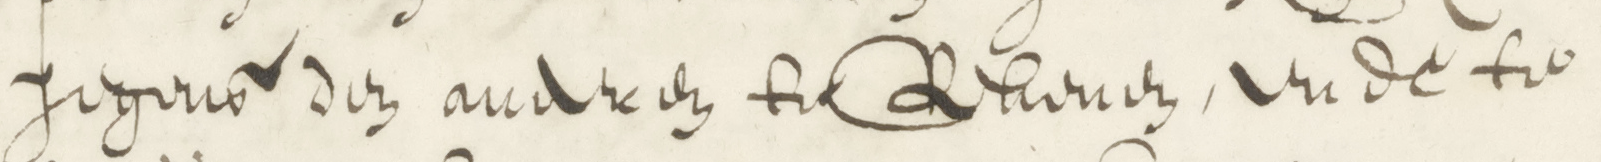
jegens den anderen te Rekenen, ende te
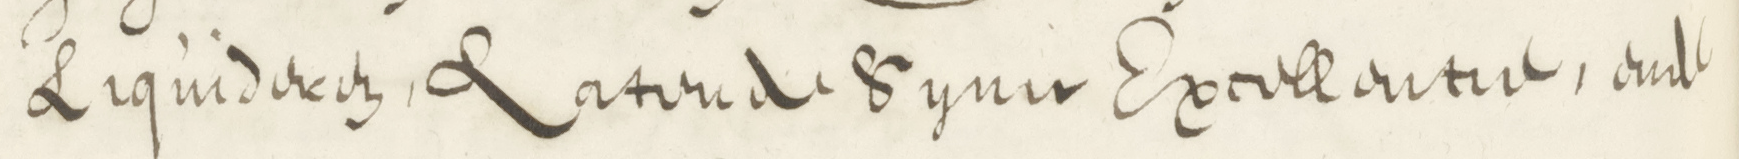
liquideren, latende sijne Excellentie, ende
